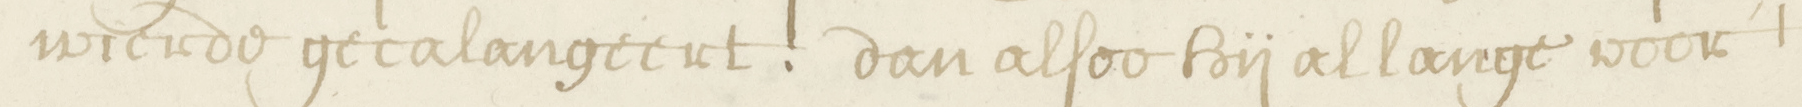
wierde gecalangeert, dan alsoo hij allange voor t
